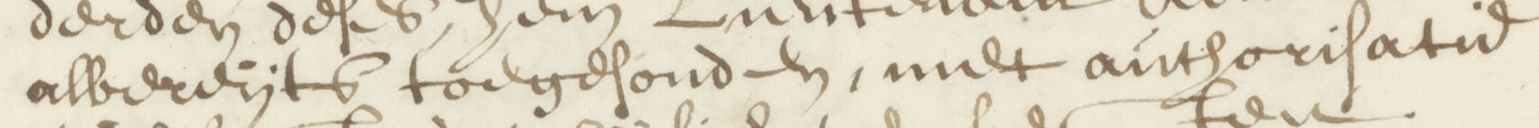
albereijts toegesonden, met authorisatie
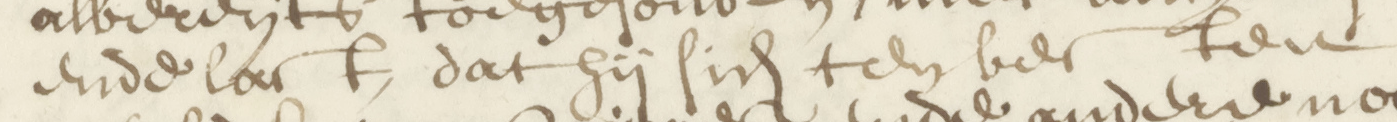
ende last, dat hij sich ten besten
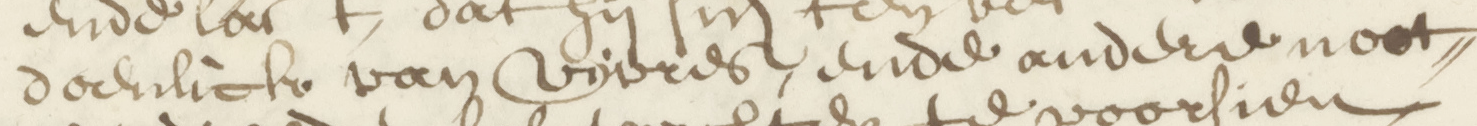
doenlick van vivres, ende andere noot„
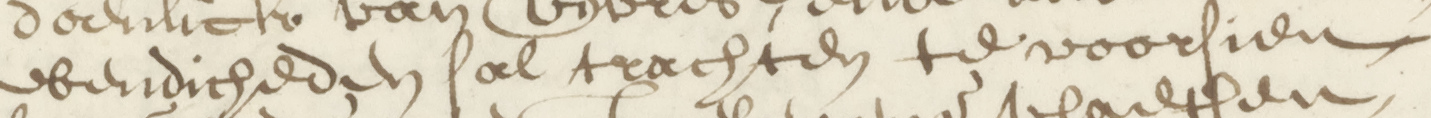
wendicheden sal trachten te voorsien,
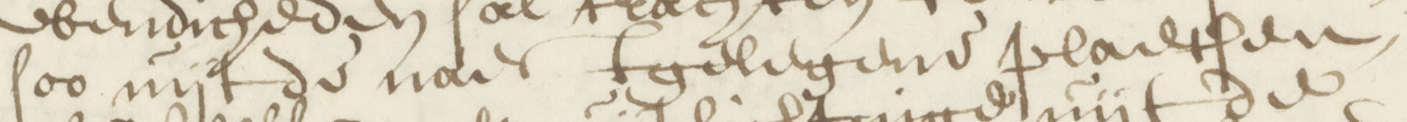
soo uijt de naestgelegene plaetsen,
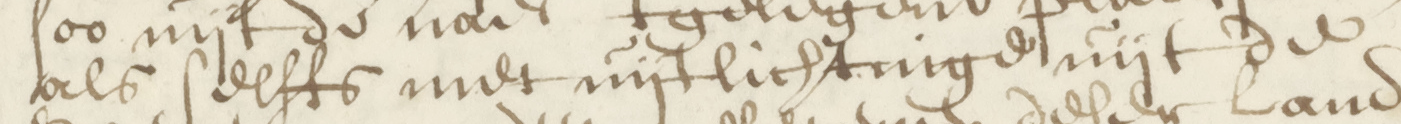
als selffs met uijtlichtinge uijt de
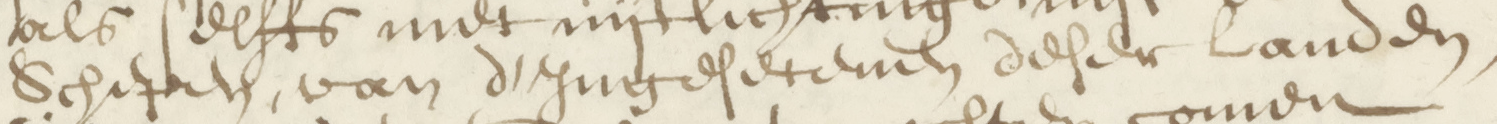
Schepen, van d‛Ingesetenen deser Landen,
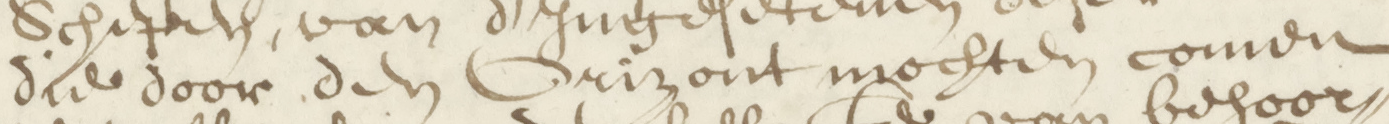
die door den Orizont mochten comen
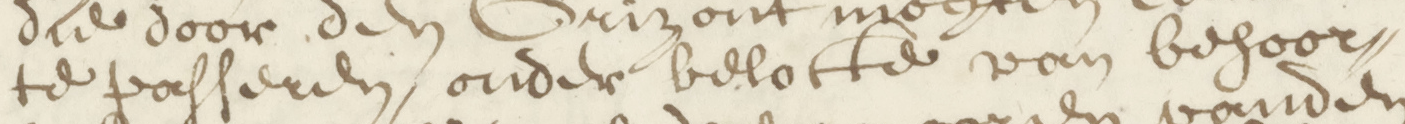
te passeren, onder belofte van behoor„
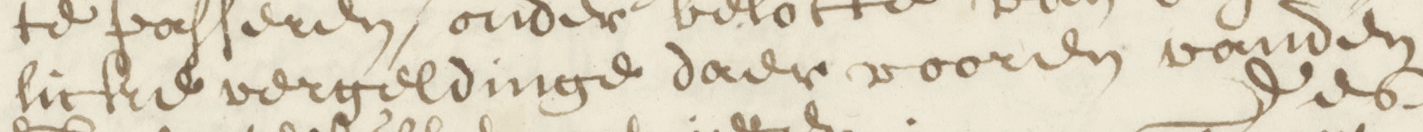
licke vergeldinge daer vooren vanden
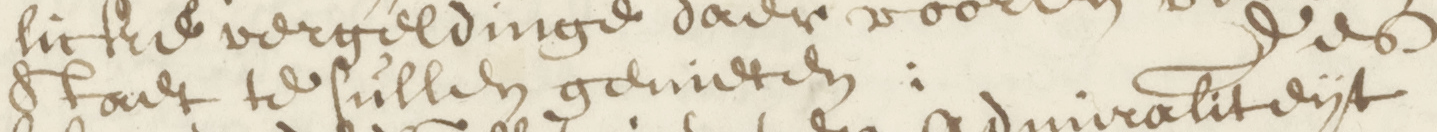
Staet te sullen genieten: Des
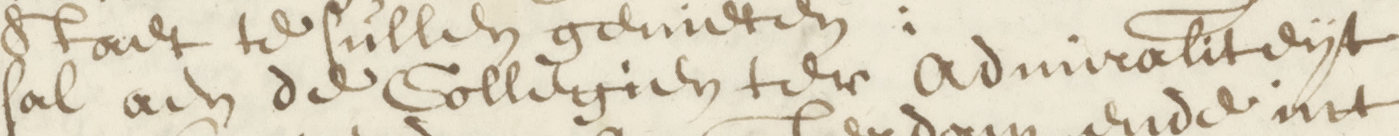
sal aen de Collegien ter Admiraliteijt
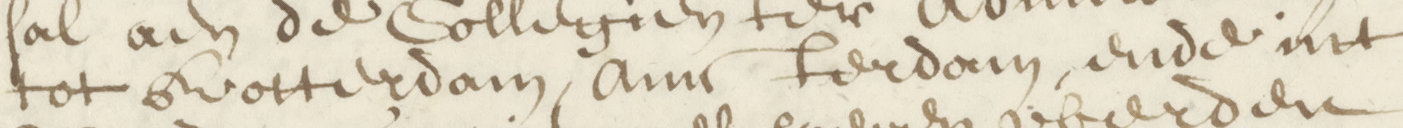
tot Rotterdam, Amsterdam, ende int
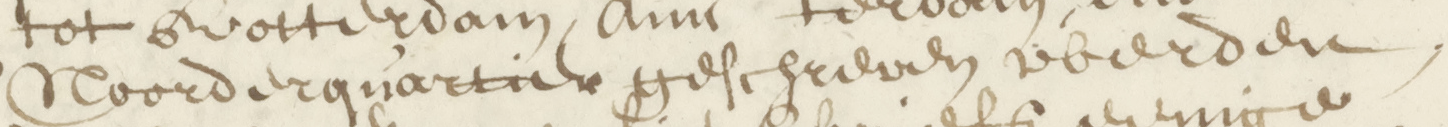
Noorderquartier geschreven werden
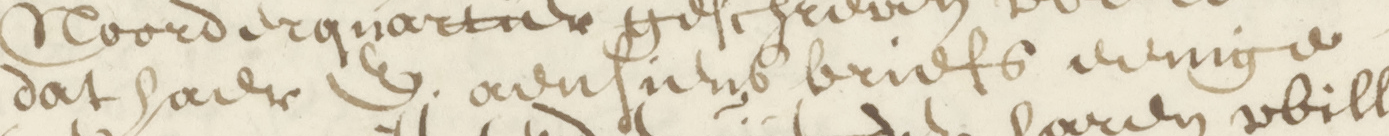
dat haer E. aensiens briefs eenige
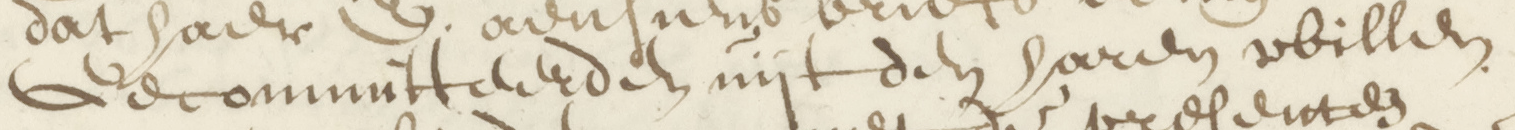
Gecommitteerden uijt den haren willen
